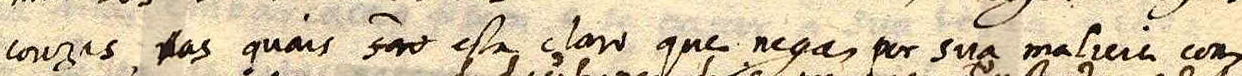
couzas, nas quais são esta claro que nega, por sua malicia com
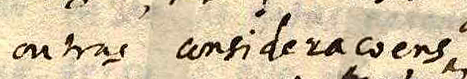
outras consideracoens
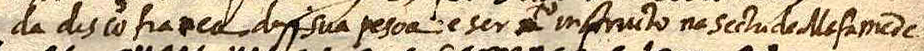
da discōfianca da sua pesoa e ser mto instructo na secta de Mafamede
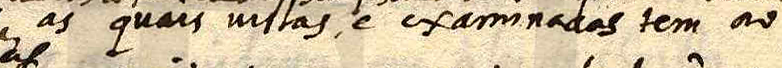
as quais uistas, e examinadas tem ao
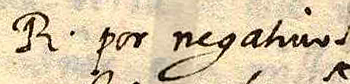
R. por negatiuo
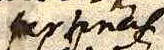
pertinas
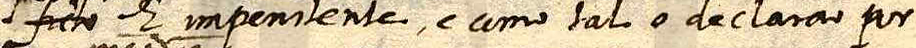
ficto E impenitente, e como tal o declarão por
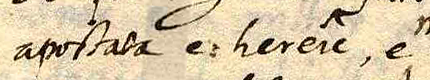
apostata e hereie, e
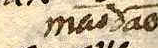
maõdão
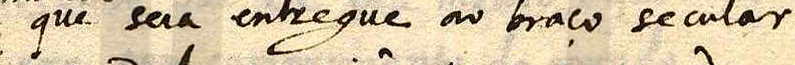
que seia entregue ao braço secular
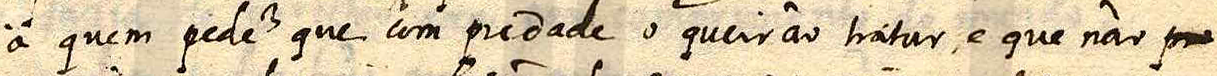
a quem pede que com piedade o queirão tratar, e que não _
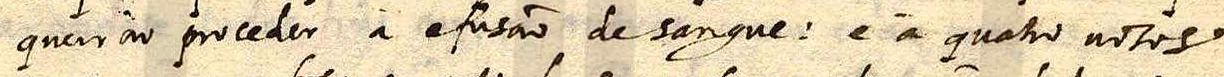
queirão proceder a efusão de sangue: e a quatro uotos
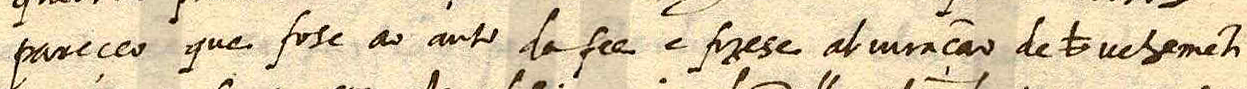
pareçeo que fose ao auto da fee e fizese abiuração de _ uehemēti
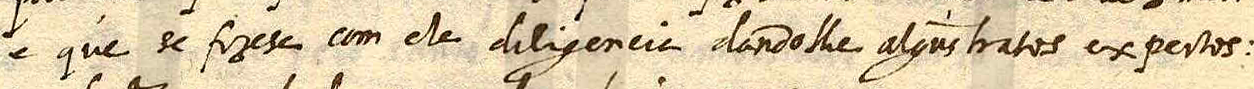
e que se fizese com ele deligencia dandolhe algūs tratos expertos:
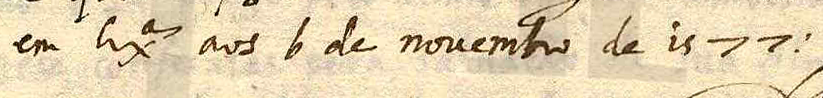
em lixa aos 6 de nouembro de i577.
